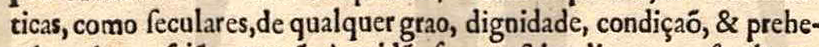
ticas, como seculares, de qualquer graõ, dignidade, condiçaõ, & prehe
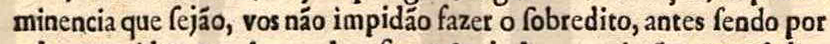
minencia que sejão, vos não impidão fazer o sobredito, antes sendo por
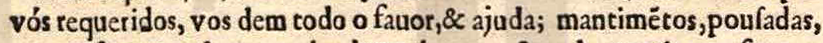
vós requeridos, vos dem todo o fauor, & ajuda; mantimētos, pousadas,
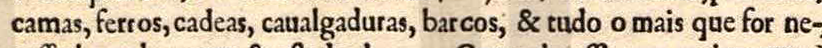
camas, ferros, cadeas, caualgaduras, barcos, & tudo o mais que for ne
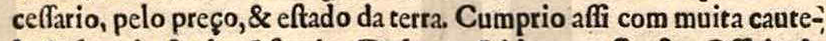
cessario, pelo preço, & estado da terra. Cumprio assi com muita caute
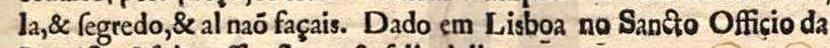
la, & segredo, & al naõ façais. Dado em Lisboa no Sancto Officio da
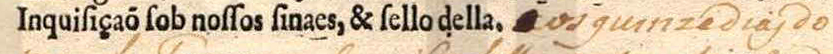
Inquisiçaõ sob nossos sinaes, & sello della. aos quinze dias do
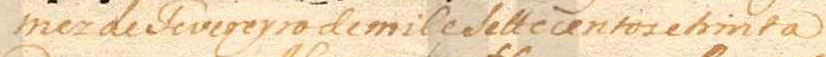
mez de Fevereyro de mil e settecentos e trinta
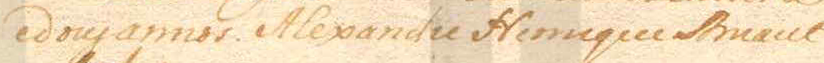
e dous annos. Alexandre Henique Arnaut
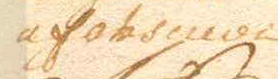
a sobscrevi
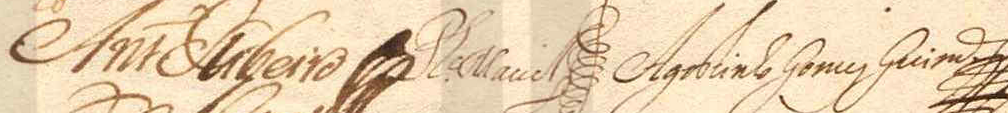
Anto Ribeiro M.e Maciel Agostinho Gomes Guime.
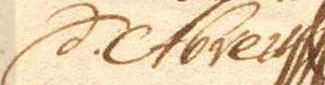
d̄. Abreu
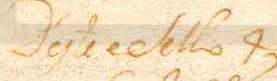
Deste e Sello 4
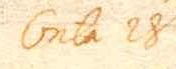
Conta 28
